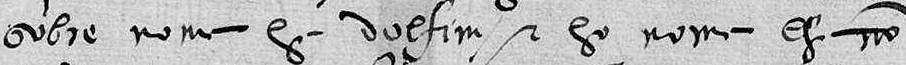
sobre nome he dolfim e ho nome lhe nō
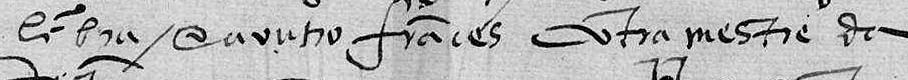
lēbra / e a outro frāces Cōtra mestre da
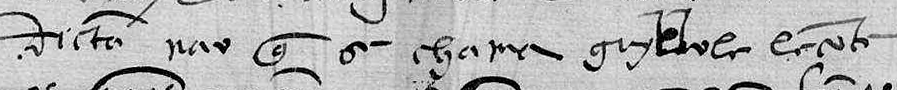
dict̄a nao q̅ se chama guyllole lecōte
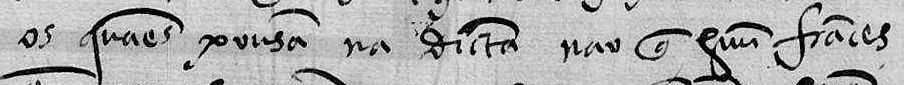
os qu̅aes pousā na di̅cta nao q̅ hu̅u frāces
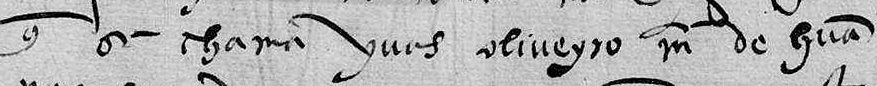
q̄ se chama yuas oliueyro mte de hu̅a
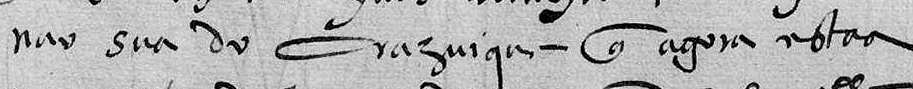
nao sua do Crazuique q̄ agora estaa
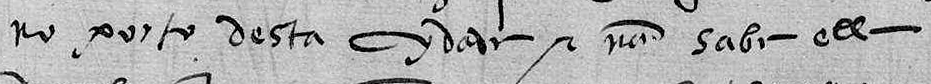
no porto desta Cydade e nā sabe elle
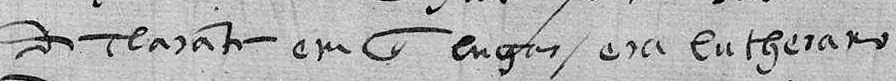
declara̅te em q̅ lugar / era lutherano
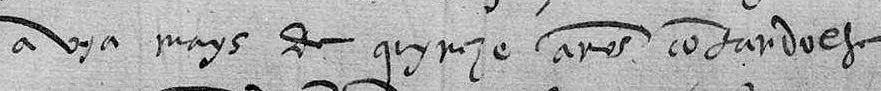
avya mays de quynze an̄os cōtandolhe
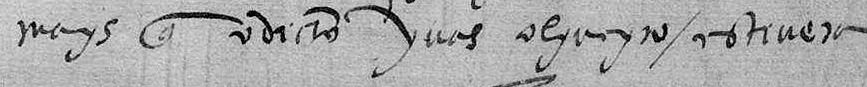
mays q̄ o dicto yuas olyueyro / estiuera
